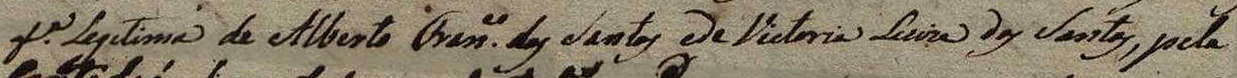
f.a Legitima de Alberto Fran.co dos Santos e de Victoria Luiza dos Santos, pela
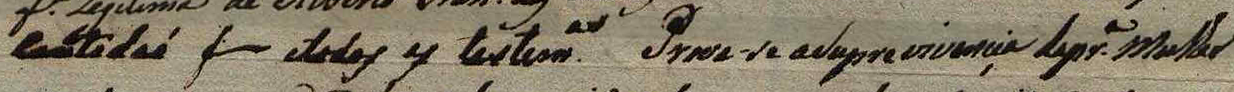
Certidaõ f e todos as testem.as Prova-se a suprevivençia da pr.a mulher
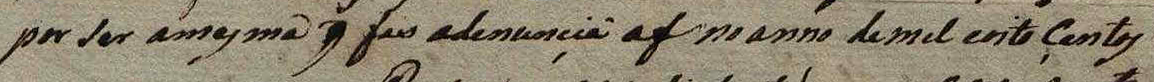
por ser a mesma q̄ fas a denunçia a f no anno de mil e oitoÇentos
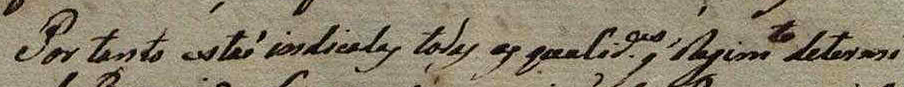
Portanto estaõ indicadas todas as qualid.es q̄ Regim.to determi
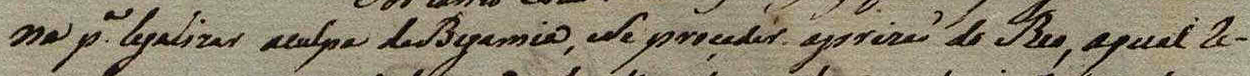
na p.a legalizar a culpa da Begamia, e se proçeder a prizaõ do Reo, a qual Re
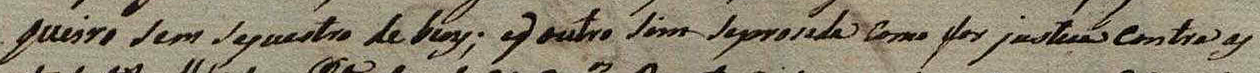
queiro sem sequestro de bens; e q̄ outrosim se proseda como for justiça contra as
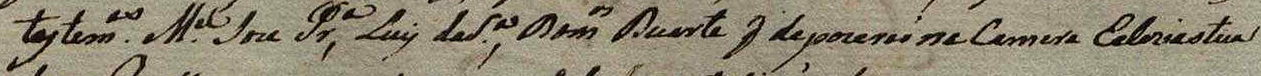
testem.as M.el Ioze Pra, Luis da S.a, Domos Duarte q̄ depozeraõ na Camera Ecleziastica
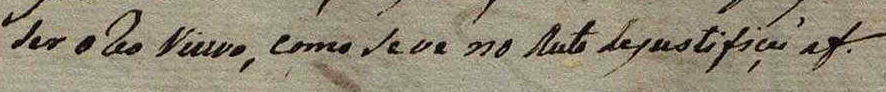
ser o Reo viuvo, como se ve no Auto de justifiçaõ a f.
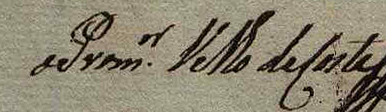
o Prom.or Velho da Costa
